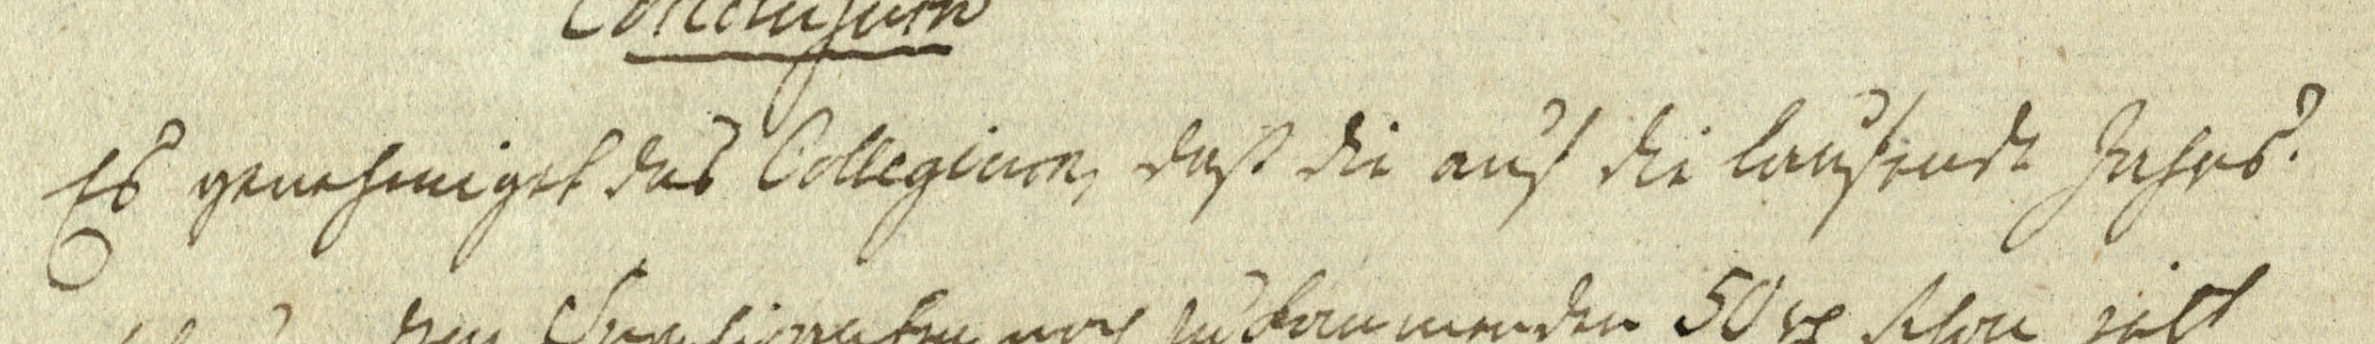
Es genehmiget das Collegium daß die auf die laufende Jahrs¬
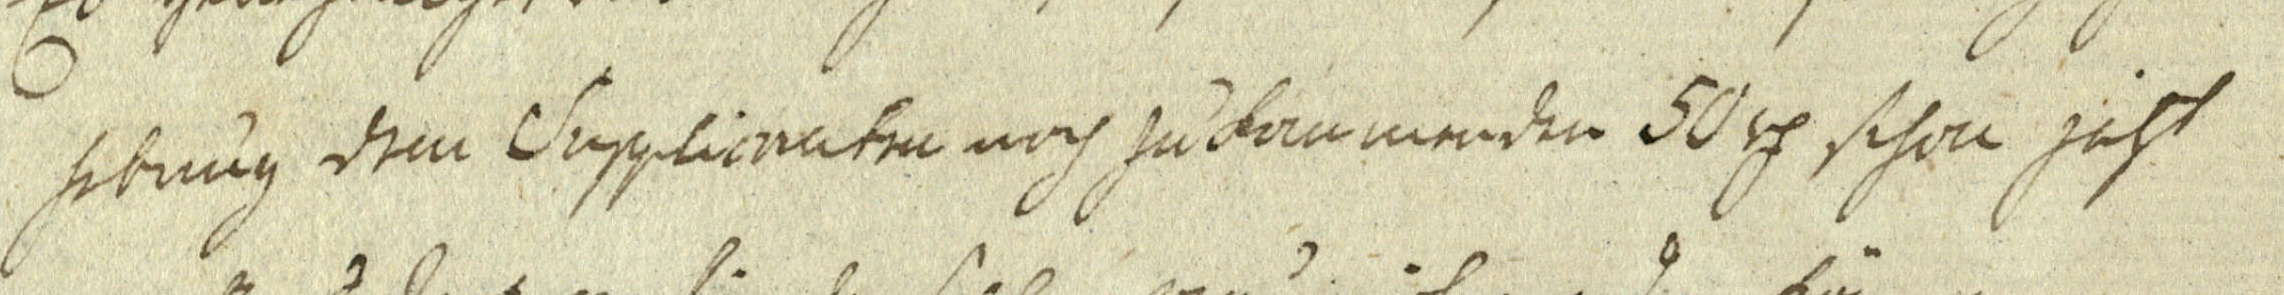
hebung dem Supplicanten noch zukommenden 50 rt schon jetzt
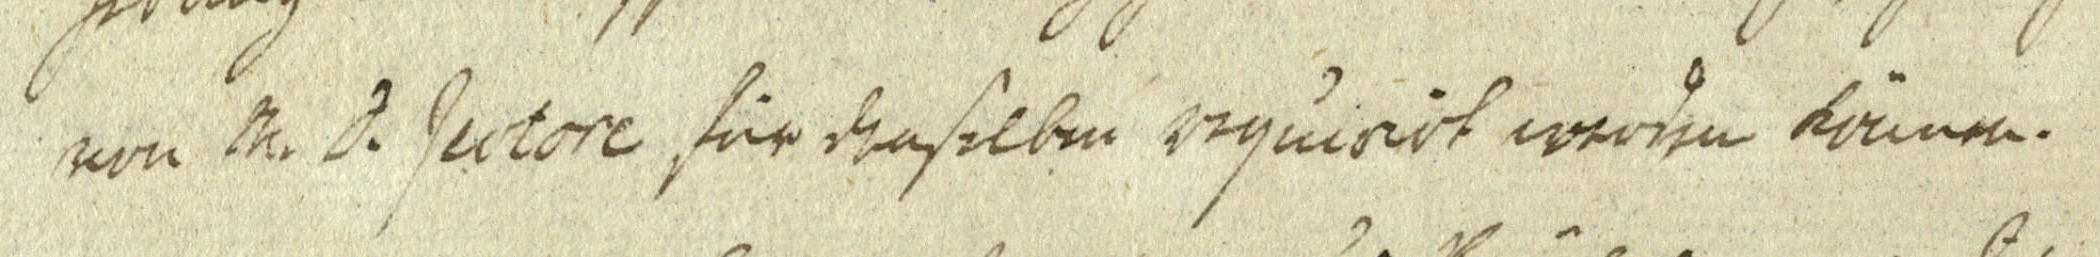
von M. D. Rectore für denselben requirirt werden können.
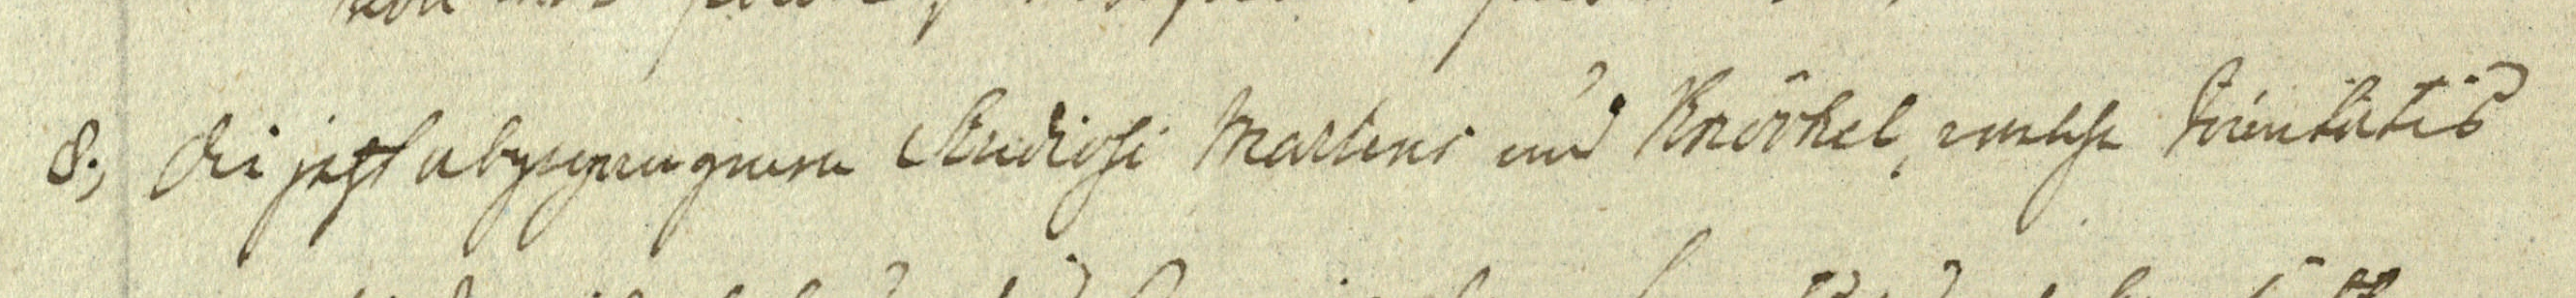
8, die jetzt abgegangen Studiosi Martens und Knöchel, welche Trinitatis
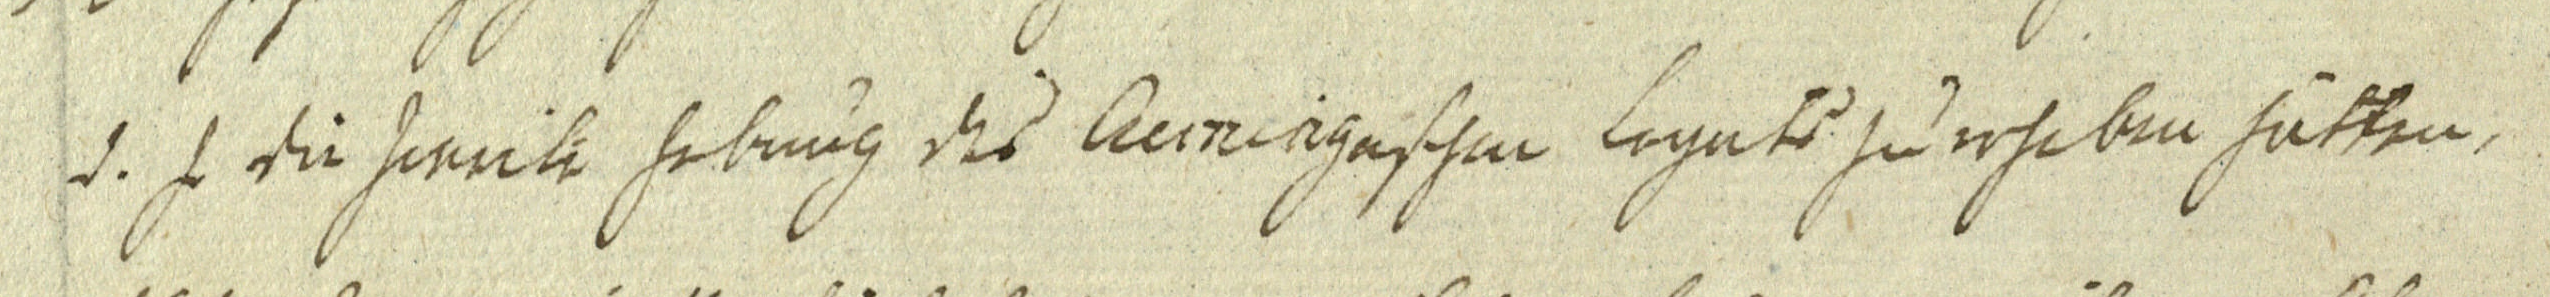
d. J die zweite Hebung des Aemingaschen Legats zu erheben hätten,
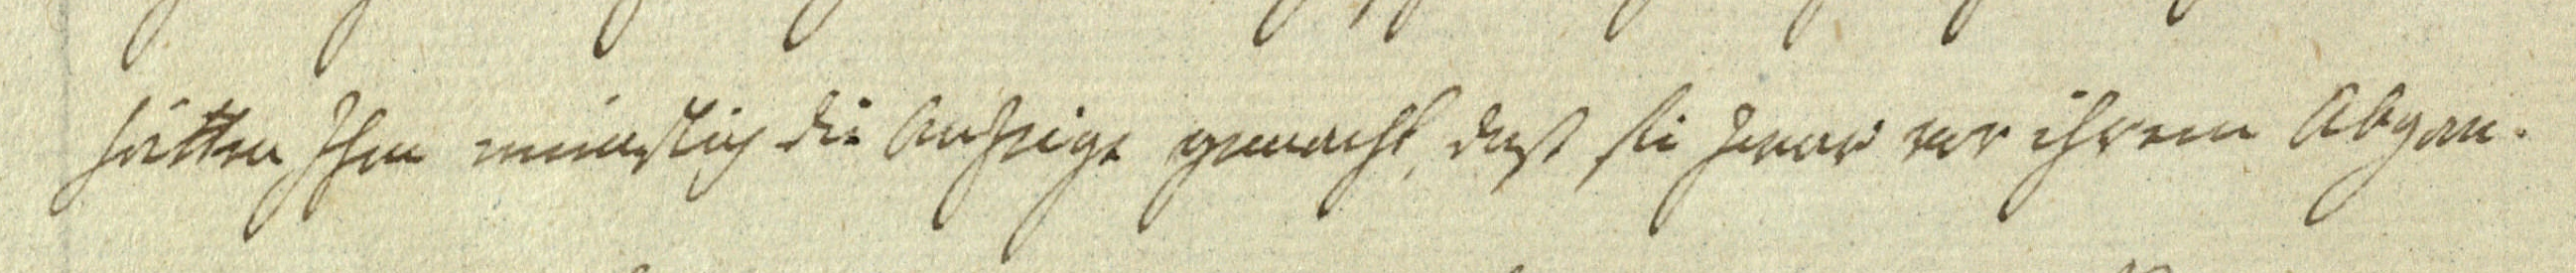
hätten Ihm mündlich die Anzeige gemacht, daß sie zwar vor ihrem Abgan¬
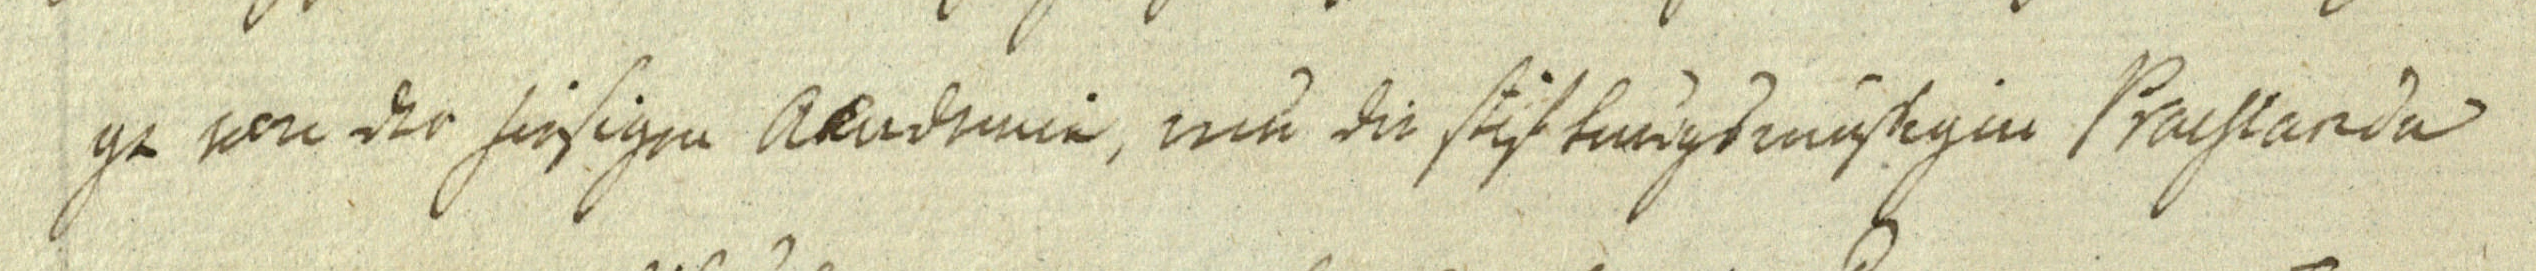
ge von der hiesigen Akademie, um die stiftungsmäßigen Praestanda
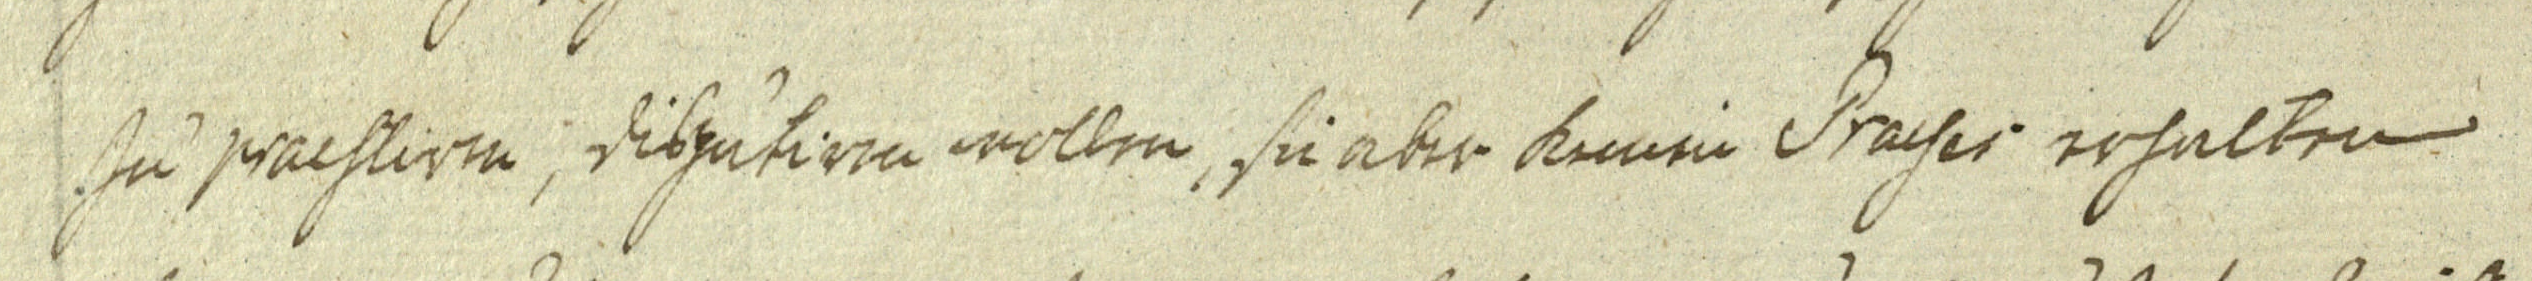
zu praestiren, disputiren wollen, sie aber keinen Praeses erhalten
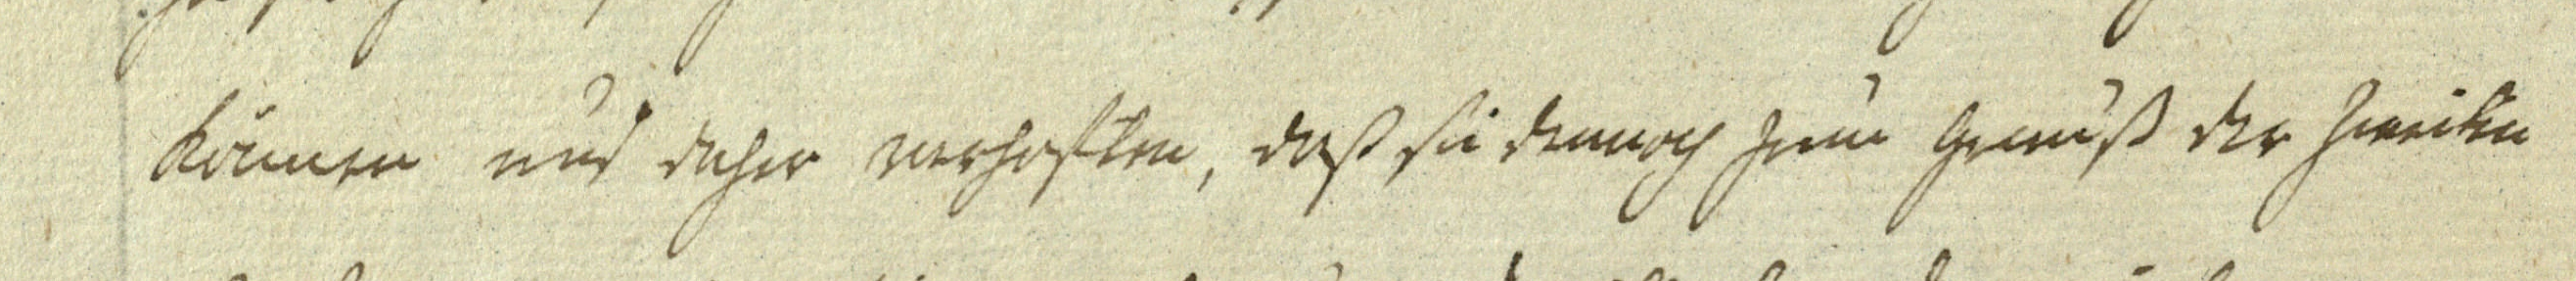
können und daher verhoften, daß sie dennoch zum Genuß der zweiten
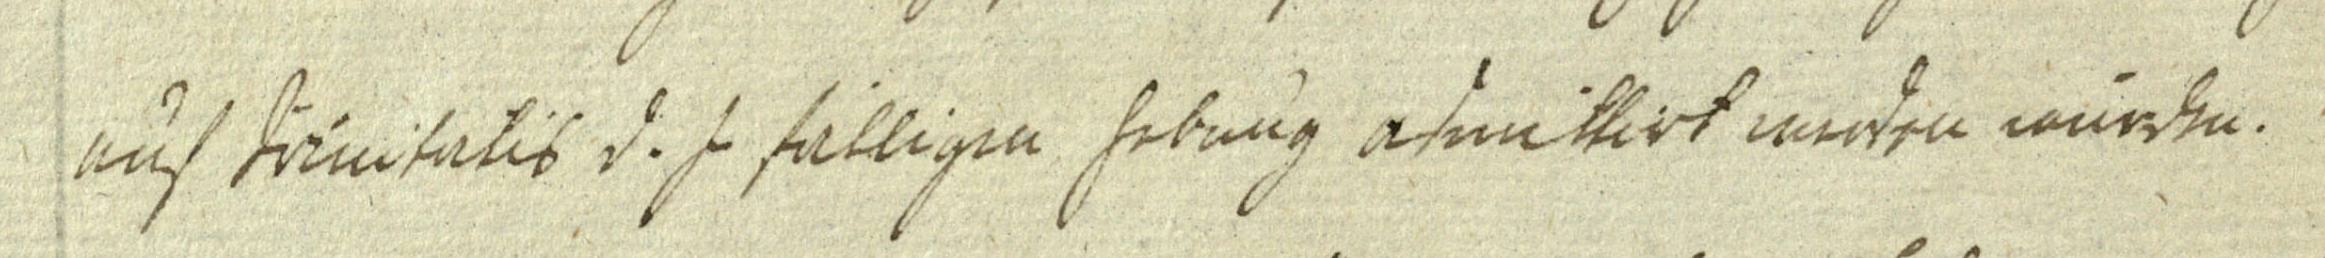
auf Trinitatis d. J fälligen Hebung admittirt werden würden.
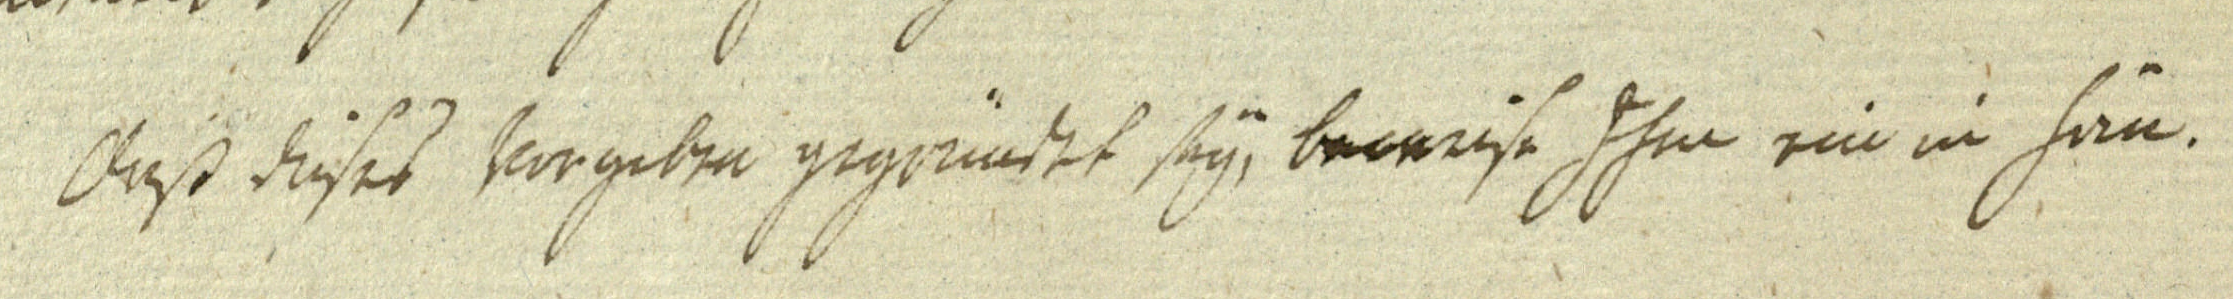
Daß dieses Vergeben gegründet seÿ, beweise Ihm ein in Hän¬
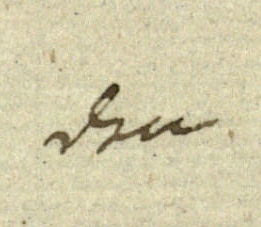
den
